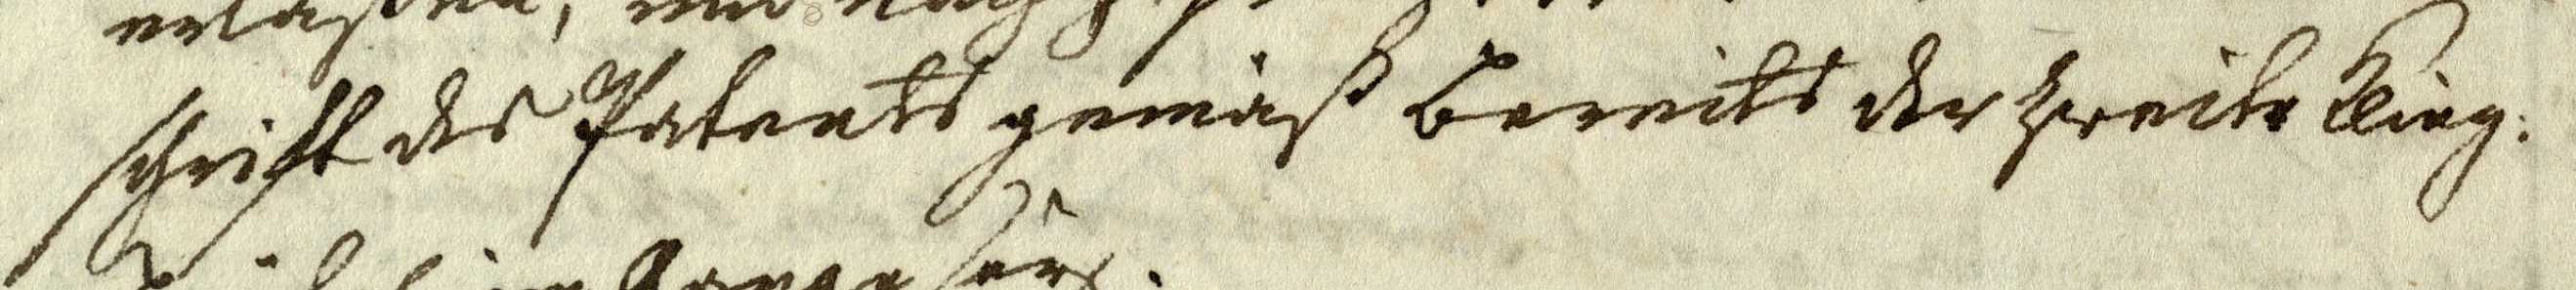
schrift des Patents gemäß bereits der zweite Kling¬
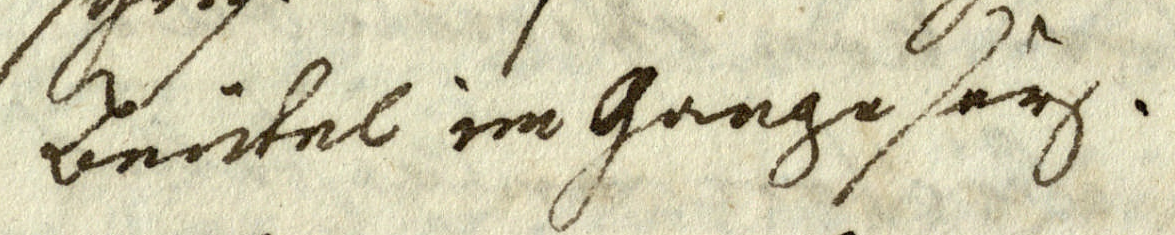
beutel im Gange seÿ.
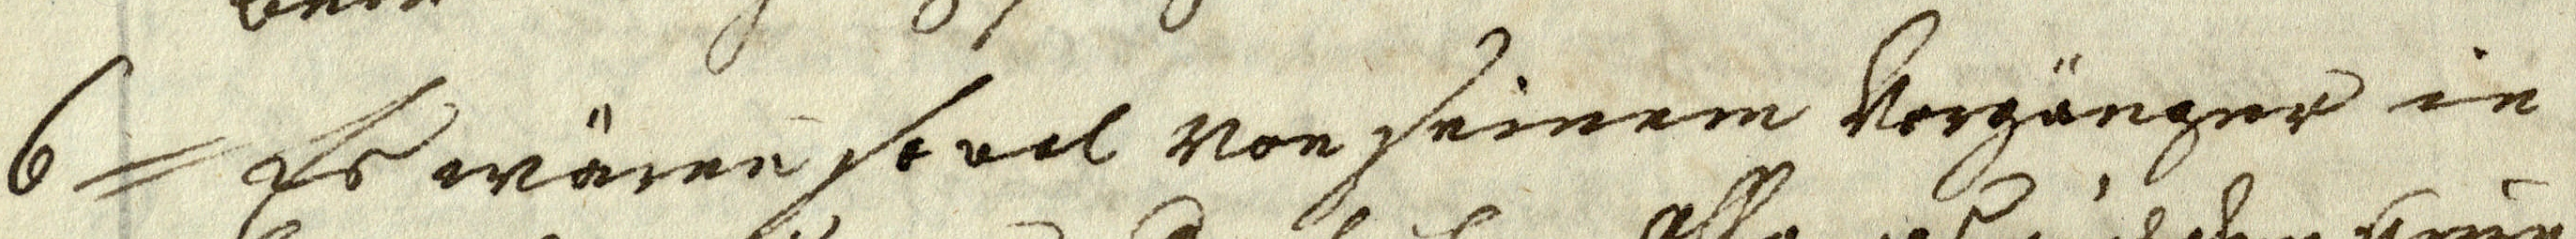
6. Es wären sowol von seinem Vorgänger in
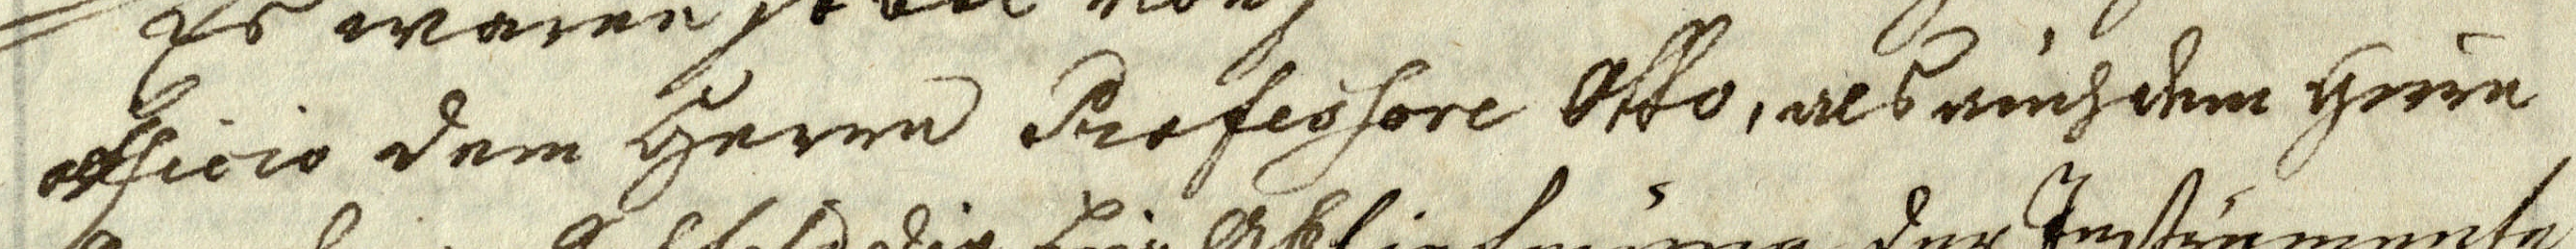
officio dem Herrn Professore Otto, als auch dem Herrn
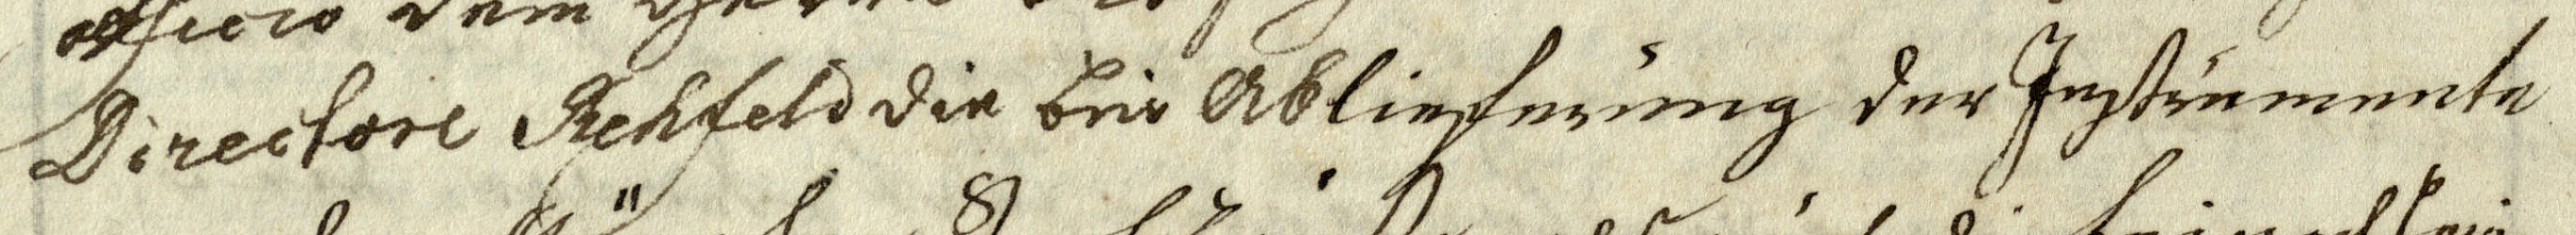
Directore Rehfeld die bei Ablieferung der Instrumente
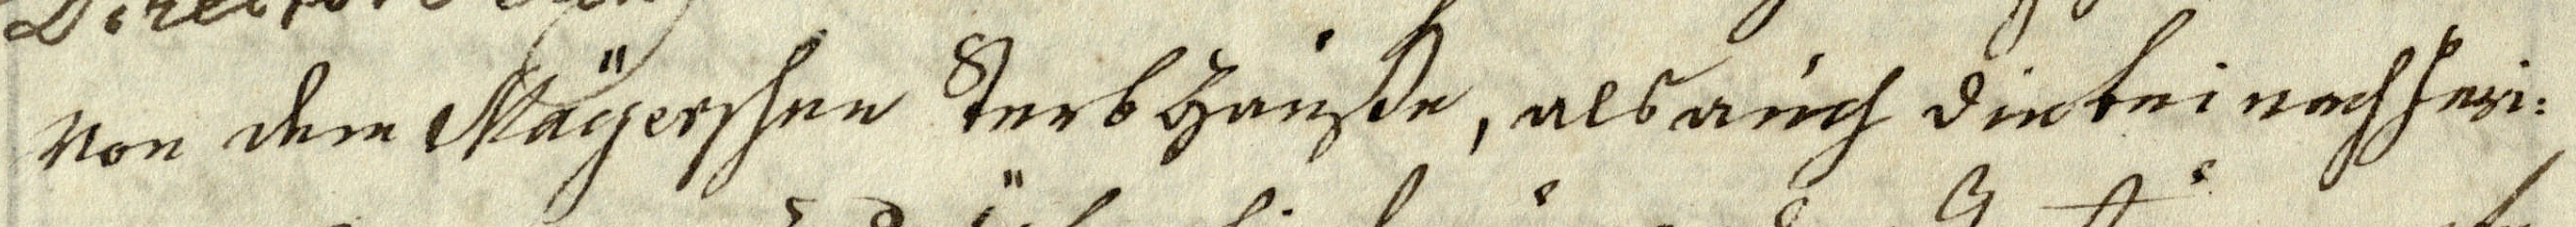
von dem Maÿerschen Sterb Hauße, als auch die bei nachheri¬
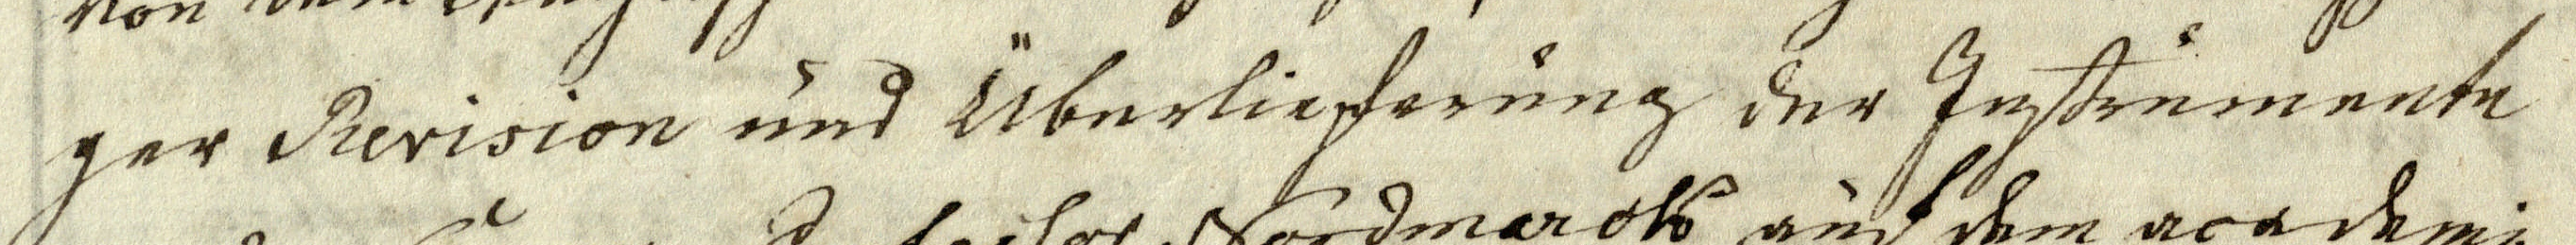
ger Revision und Überlieferung der Instrumente
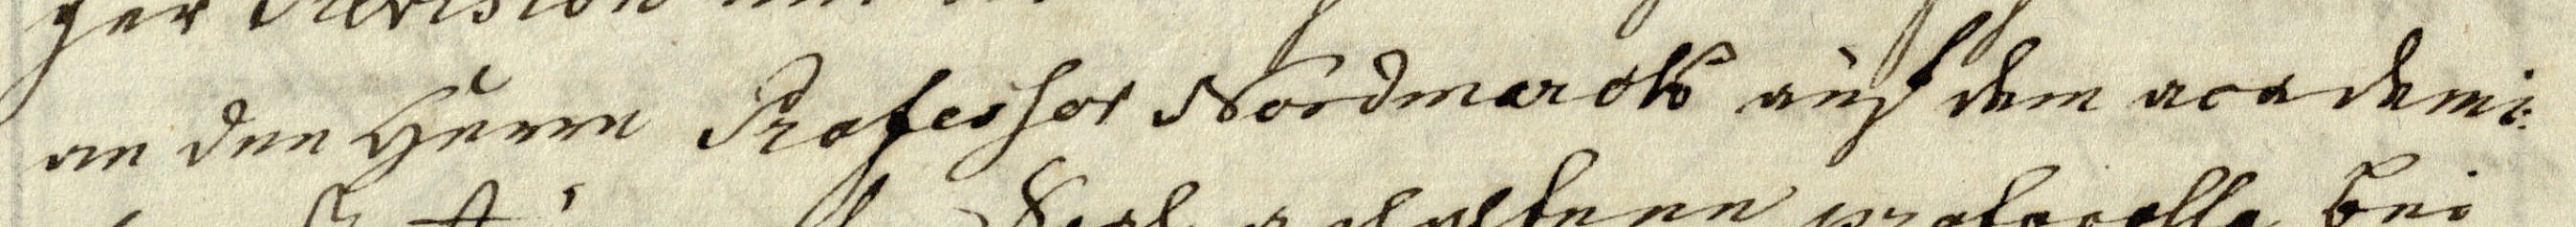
an den Herrn Professor Nordmarck auf dem academi¬
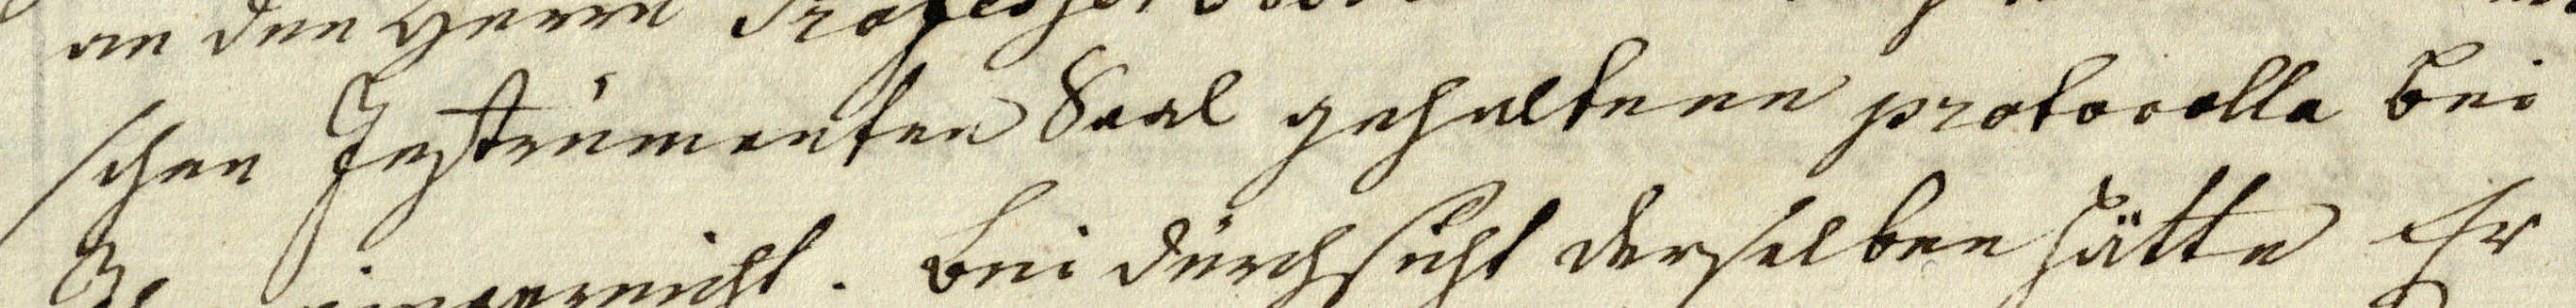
schen Instrumenten Saal gehaltene protocolla bei
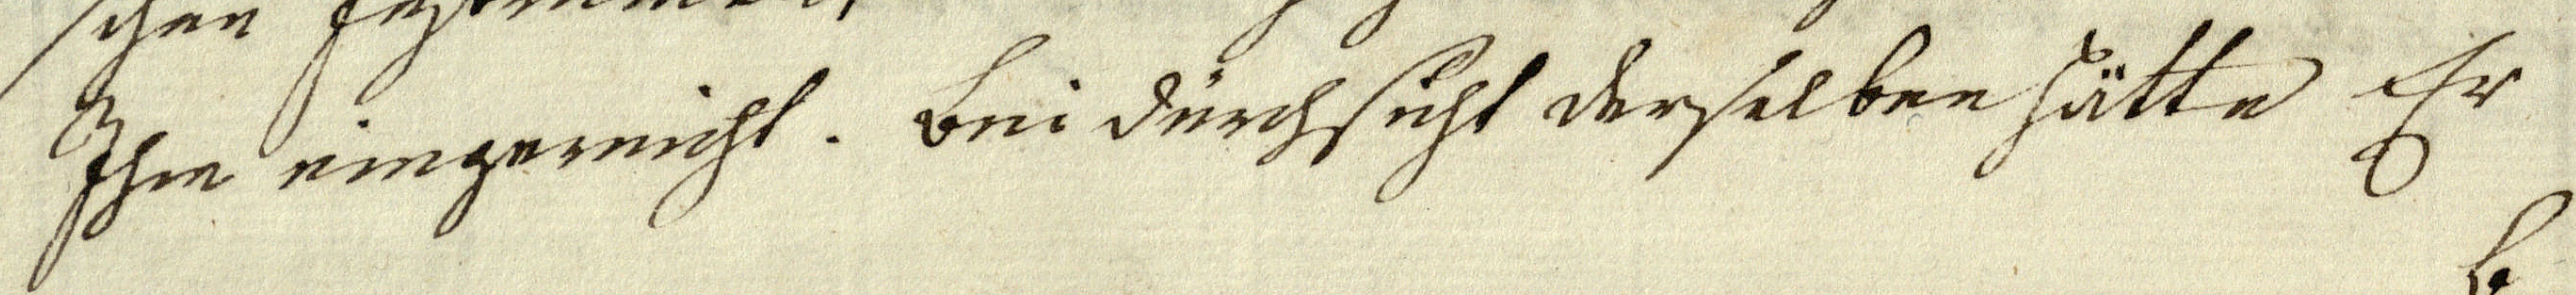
Ihm eingereicht. Bei Durchsicht derselben hätte Er
